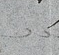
pris
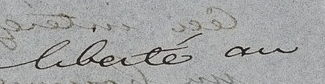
la liberté au
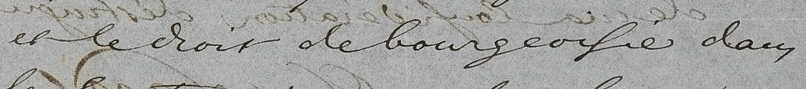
et le droit de bourgeoisie dans
